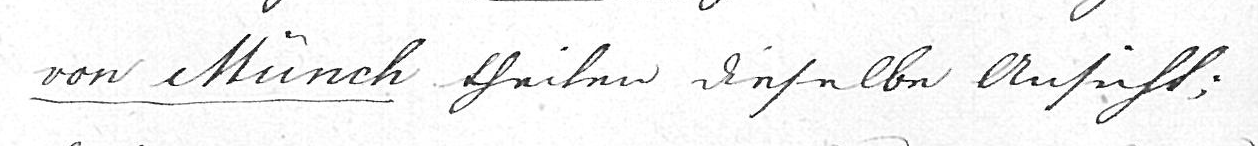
von Münch theilen dieselbe Ansicht;
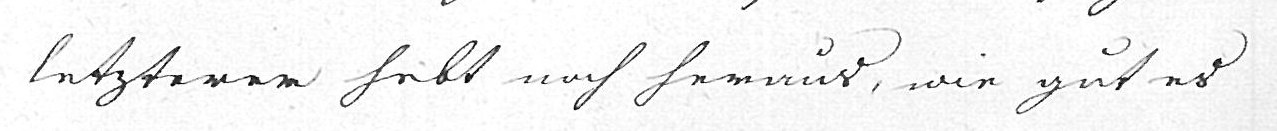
letzterer hebt noch heraus, wie gut es
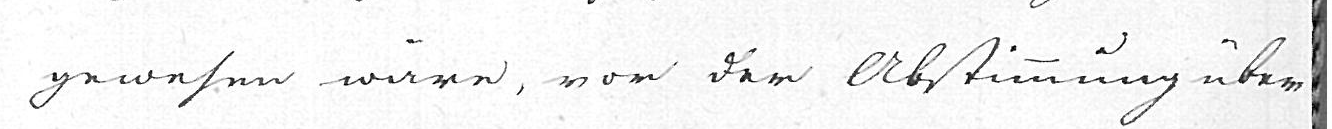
gewesen wäre, vor der Abstimmung über
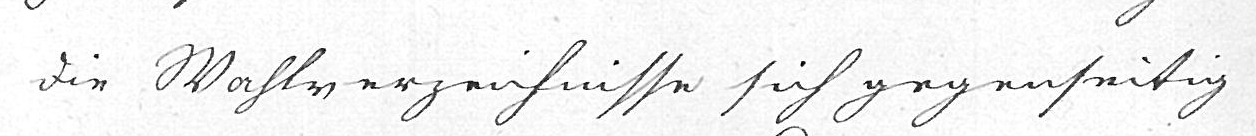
die Wahlverzeichnisse sich gegenseitig
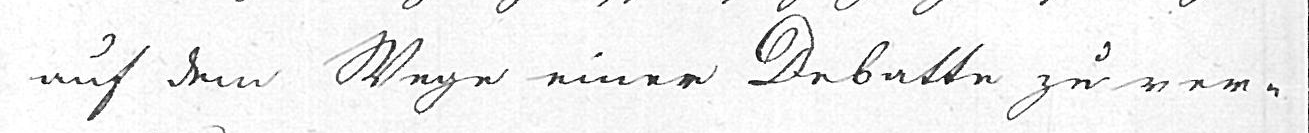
auf dem Wege einer Debatte zu ver-
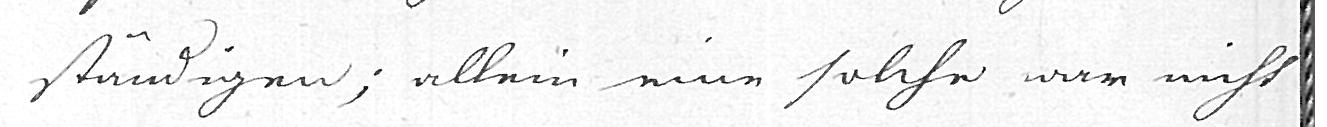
ständigen; allein eine solche war nicht
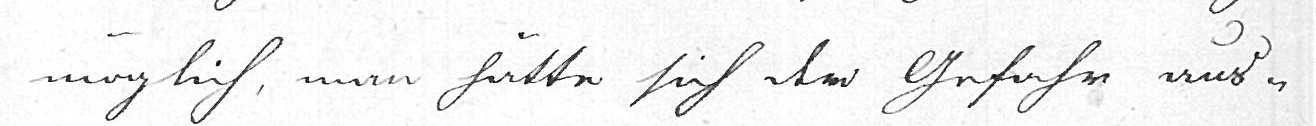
möglich, man hätte sich der Gefahr aus-
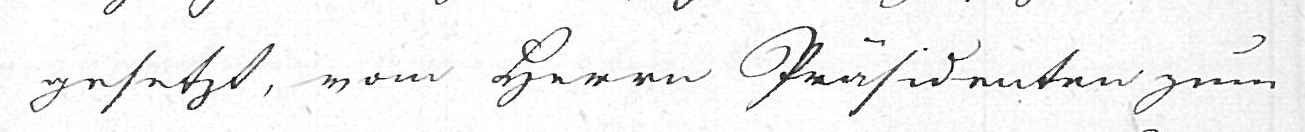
gesetzt, vom Herrn Präsidenten zum
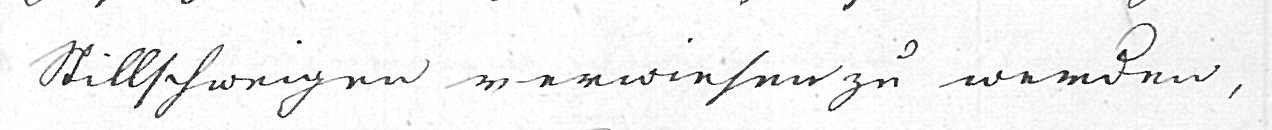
Stillschweigen verwiesen zu werden,
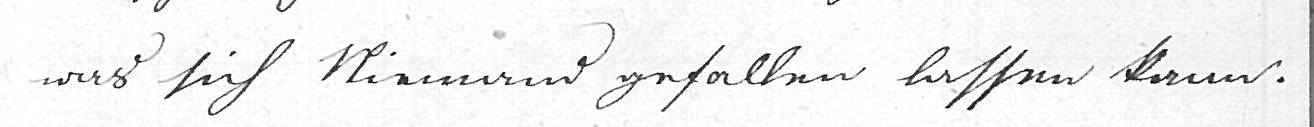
was sich Niemand gefallen lassen kann.
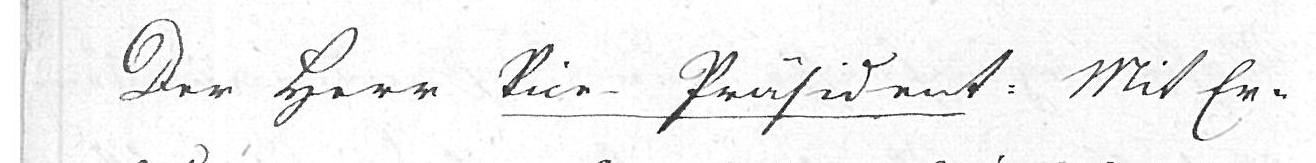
Der Herr Vice-Präsident: Mit Er-
